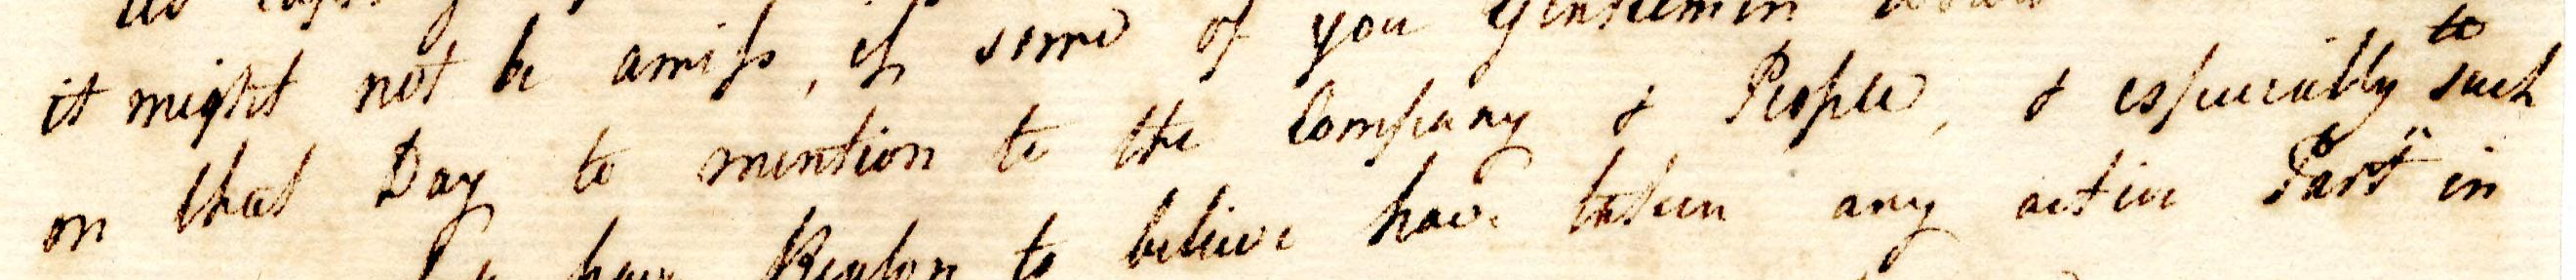on that Day to mention to the Company & People, & especially ^ such
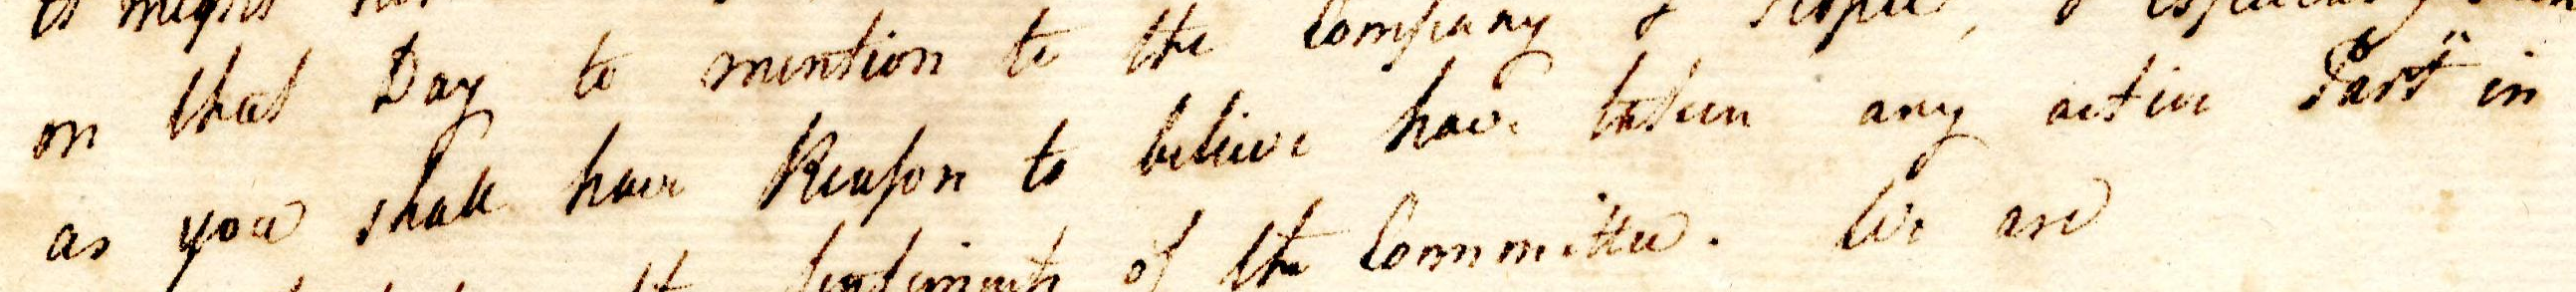as you shall hear Reason to believe have taken any active Part in
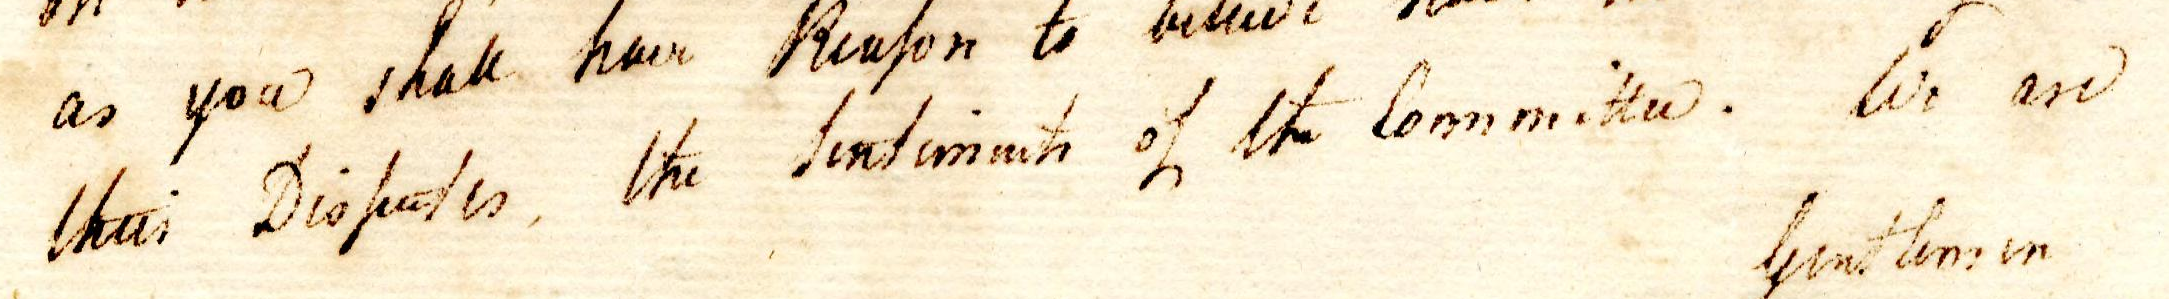their Disputes, the Sentiments of the Committee. We are
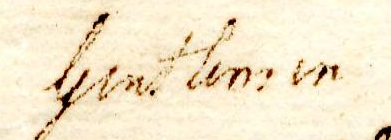Gentlemen
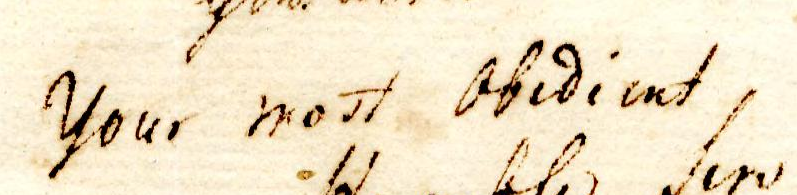Your most Obedient,
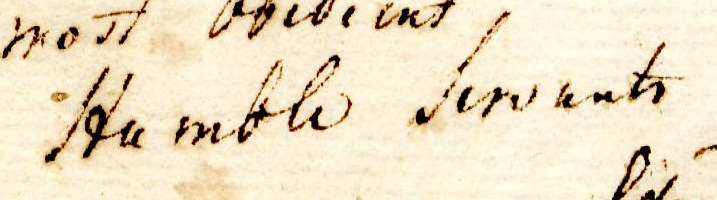Humble Servants
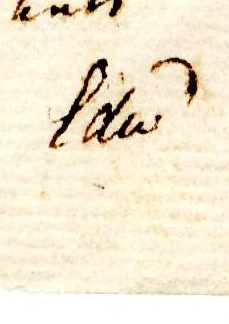Edw^d
